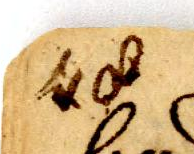48
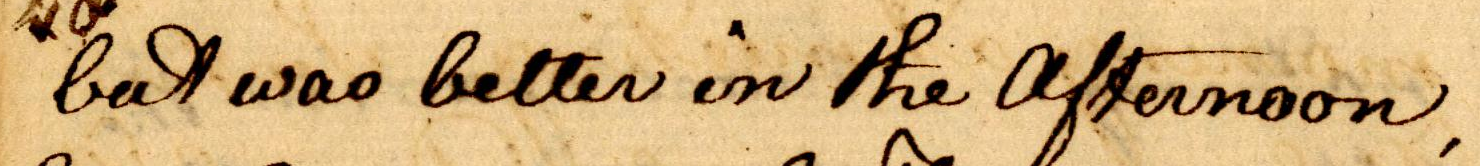but was better in the Afternoon,
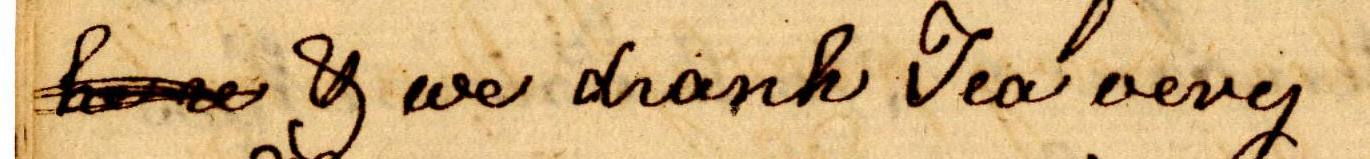[here] & we drank Tea very
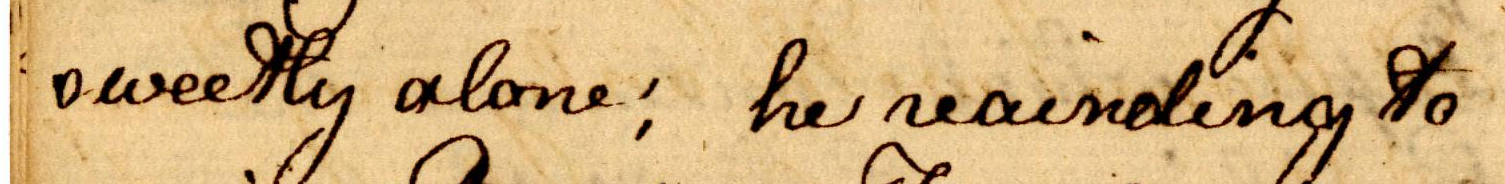sweetly alone; he reainding to
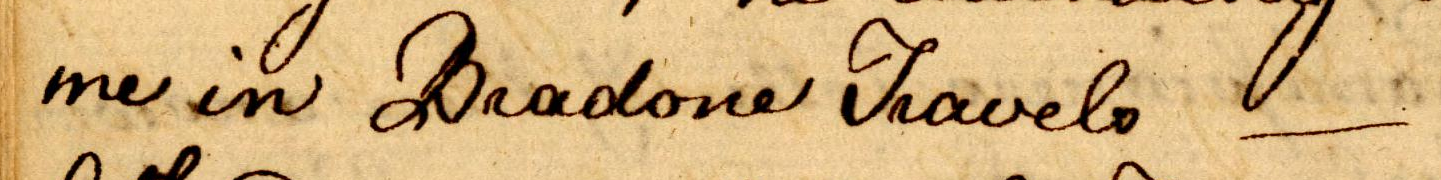me in Bradone Travels-
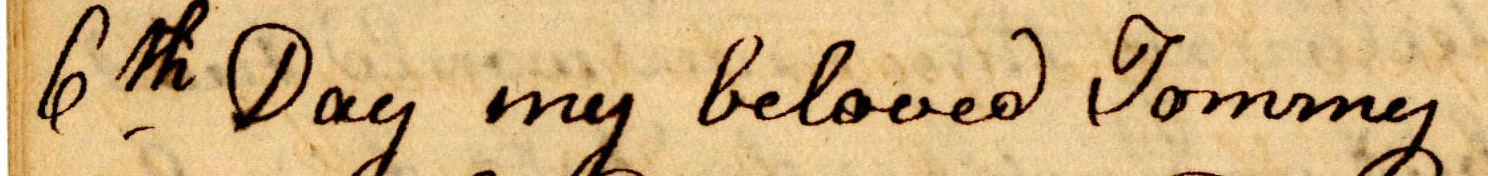6^th Day my beloved Tommy
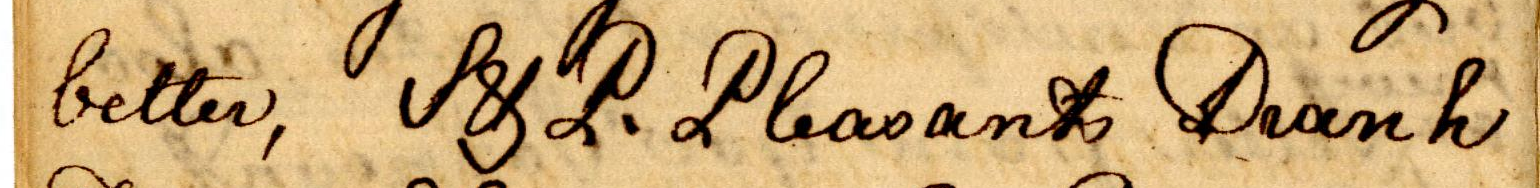better, S & P. Pleasants Drank
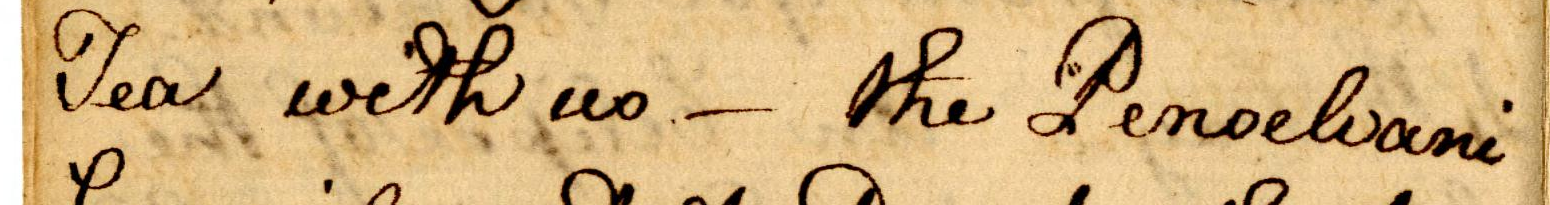Tea with us- the Penselvani
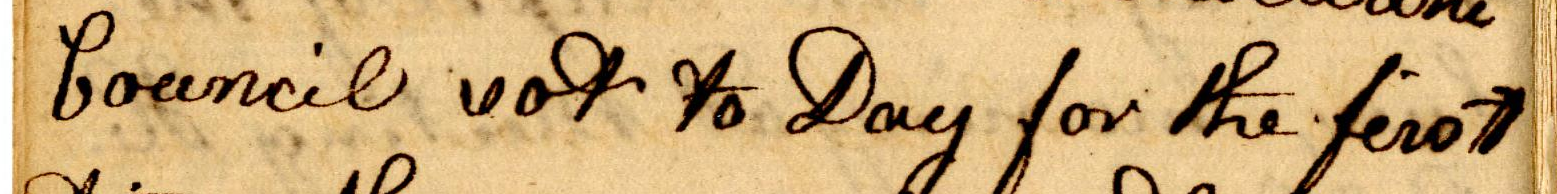Council sot to Day for the first
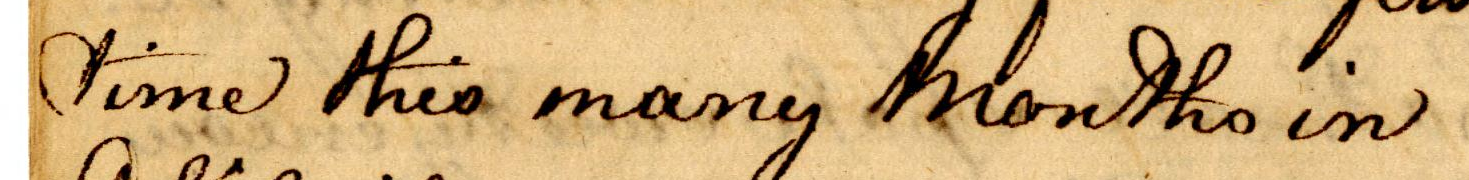time this many Months in
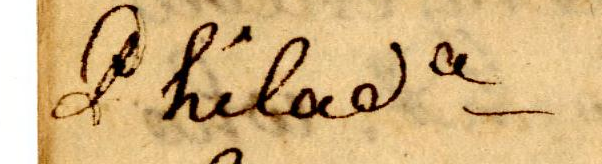Philad^a-
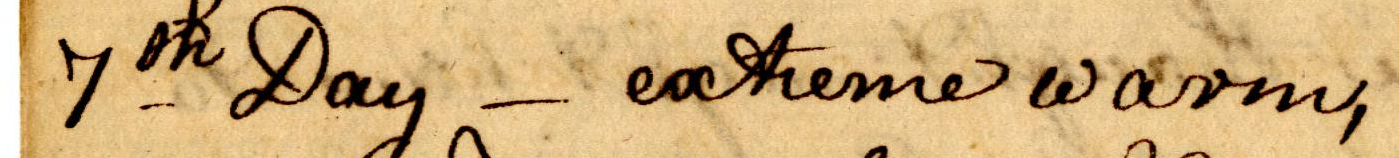7^th Day- extreme warm,
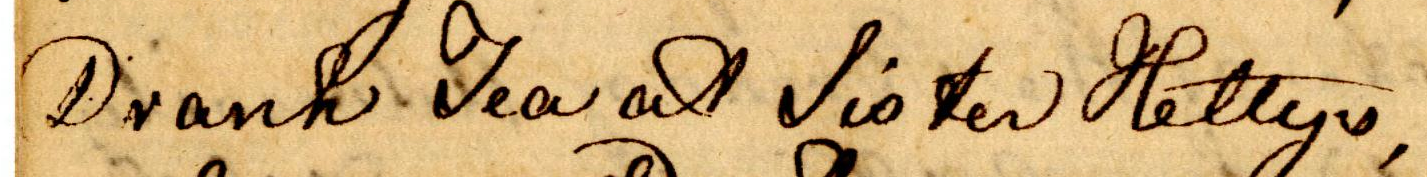Drank Tea at Sister Hettys,
